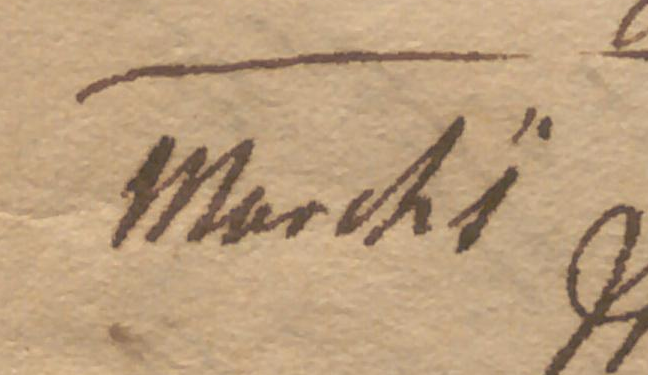March 1^t
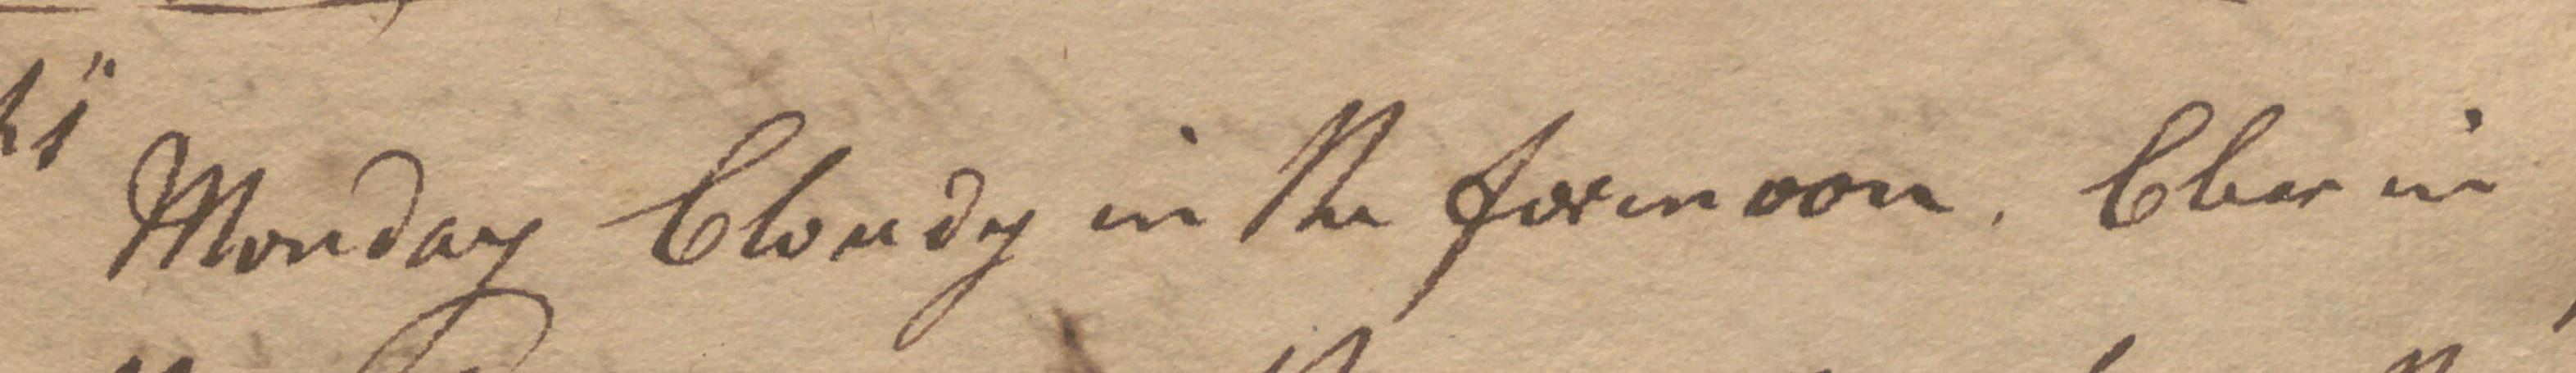Monday Cloudy in the forenoon, Clear in
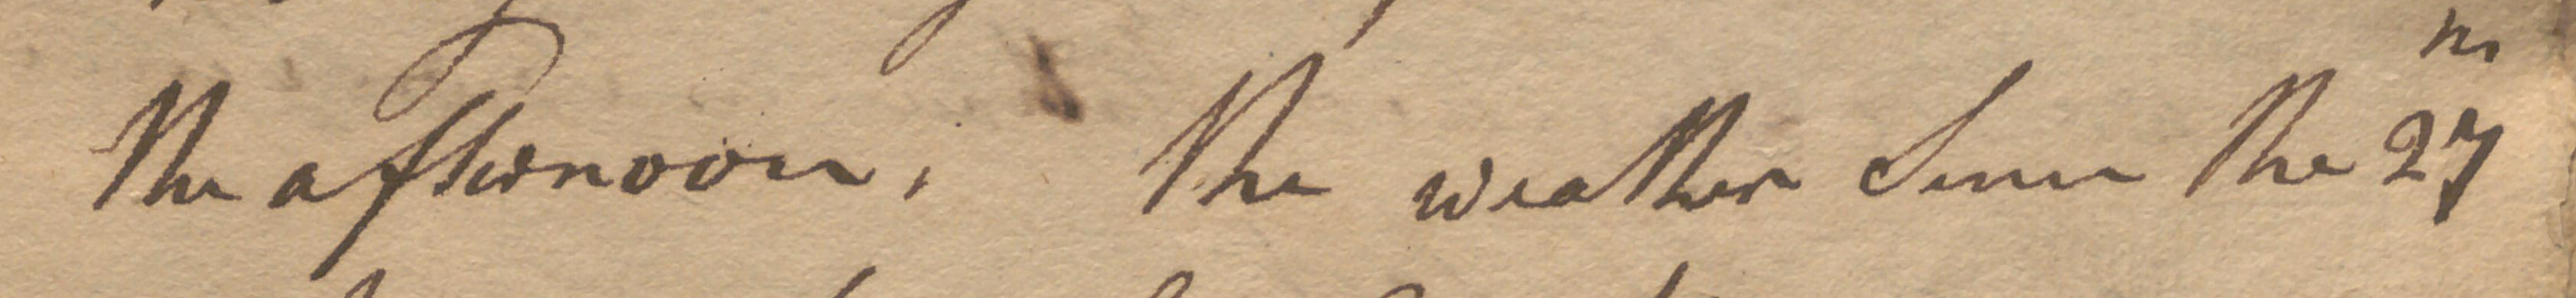the afternoon. the weather since the 27^th
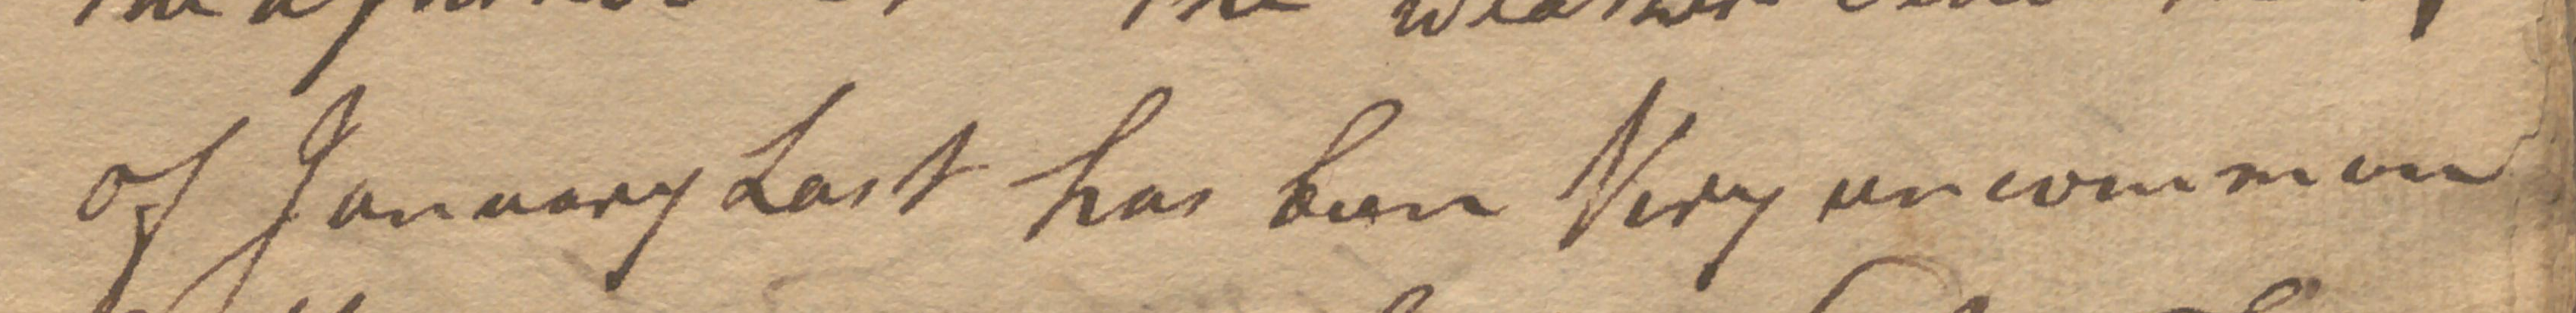of January Last has been Very uncommon
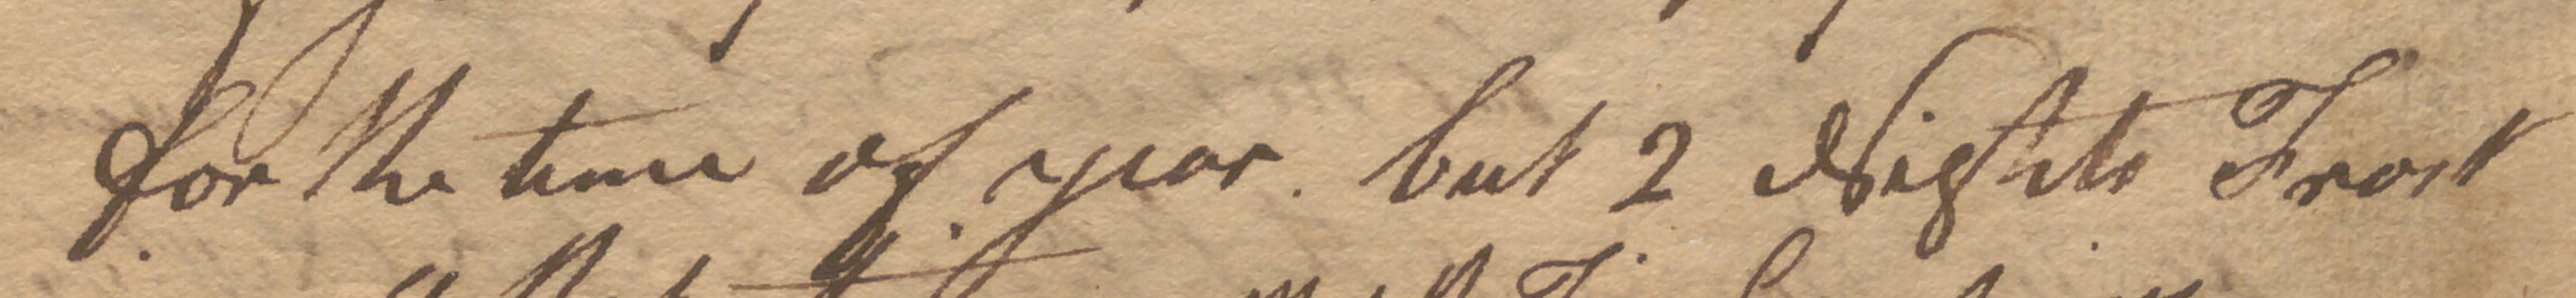for the time of year but 2 Nights Frost
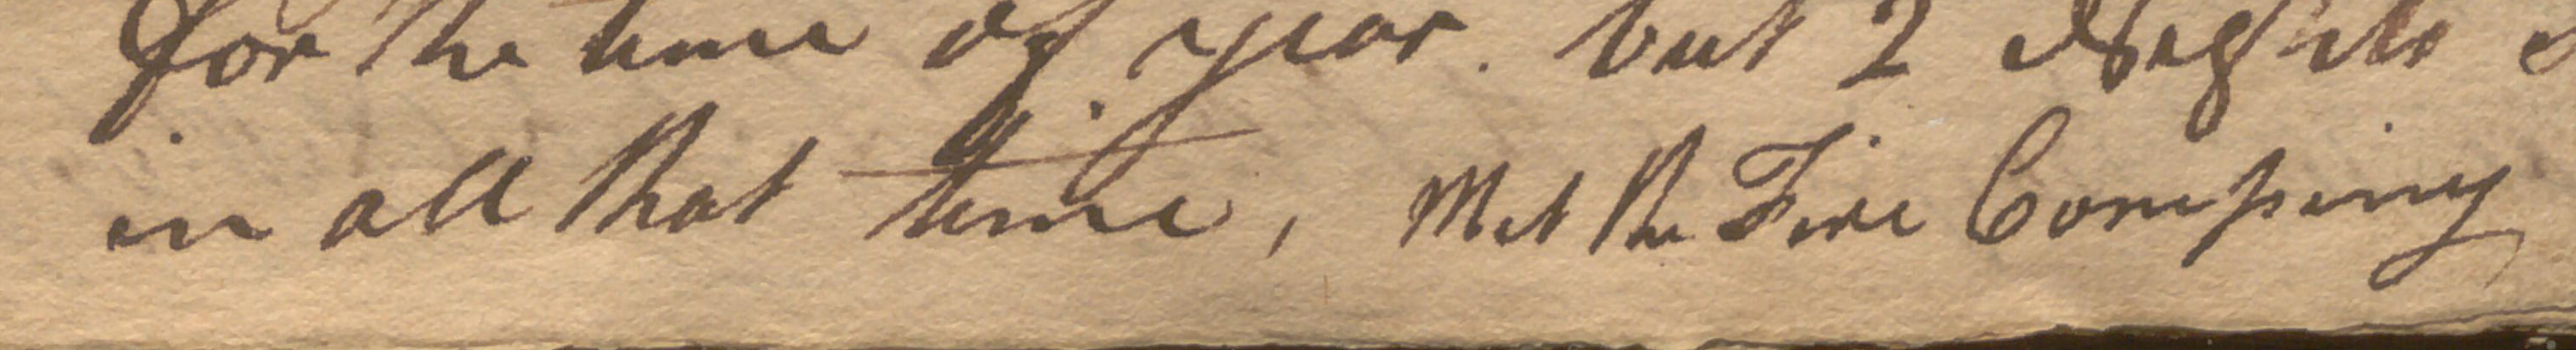in all that time, met the Fire Compiny
